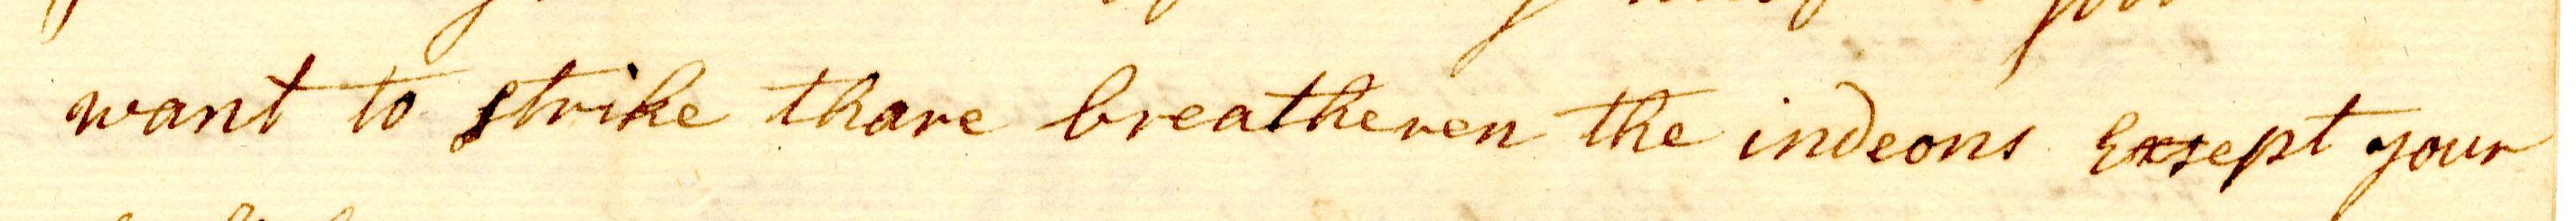want to strike thare breatheren the indeons exsept your
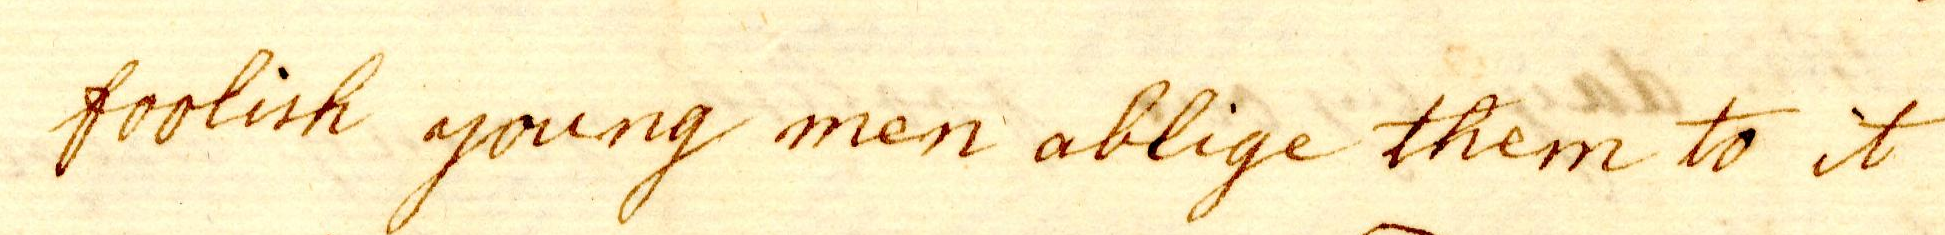foolish young men oblige them to it
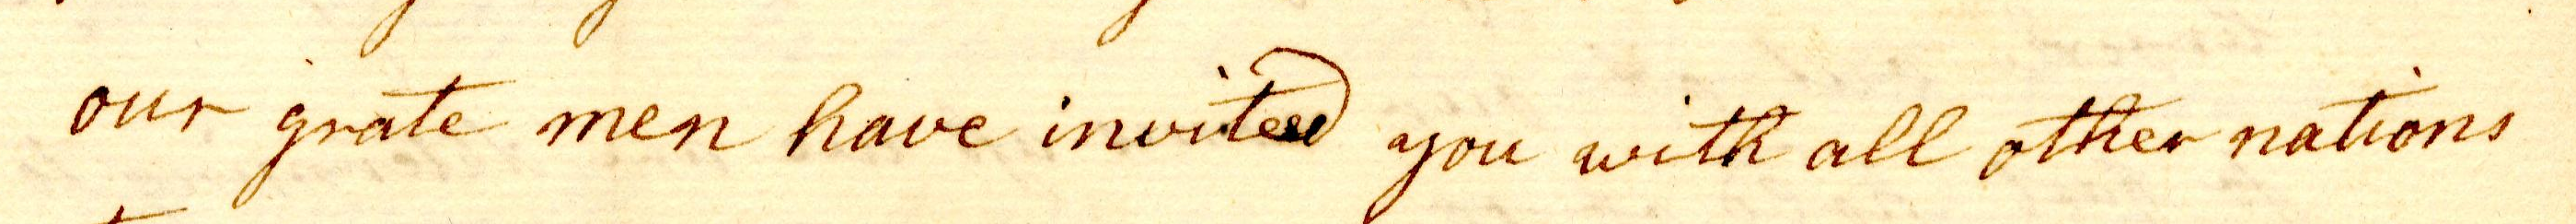our grate men have invited you with all other nations
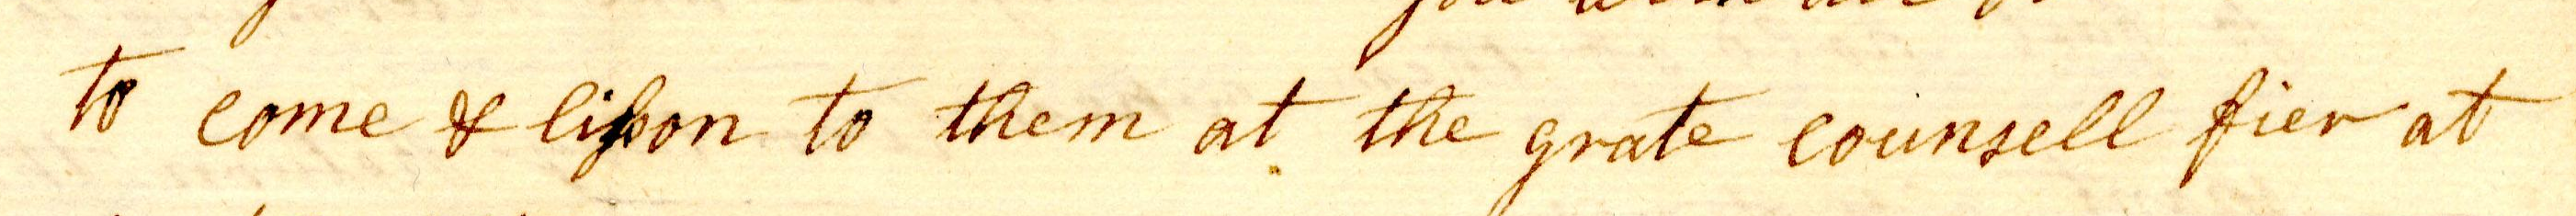to come & lisson to them at the grate counsell fier at
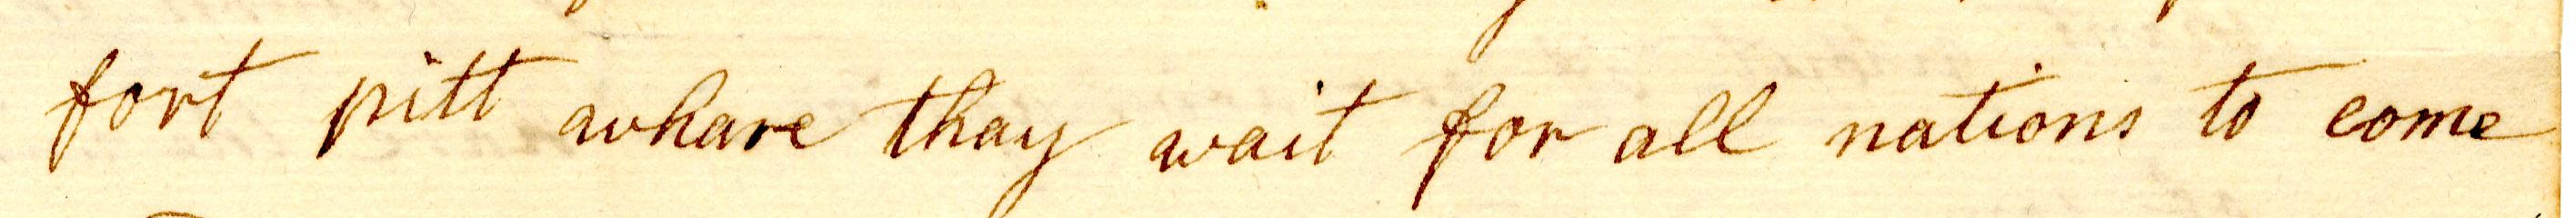fort pitt whare thay wait for all nations to come
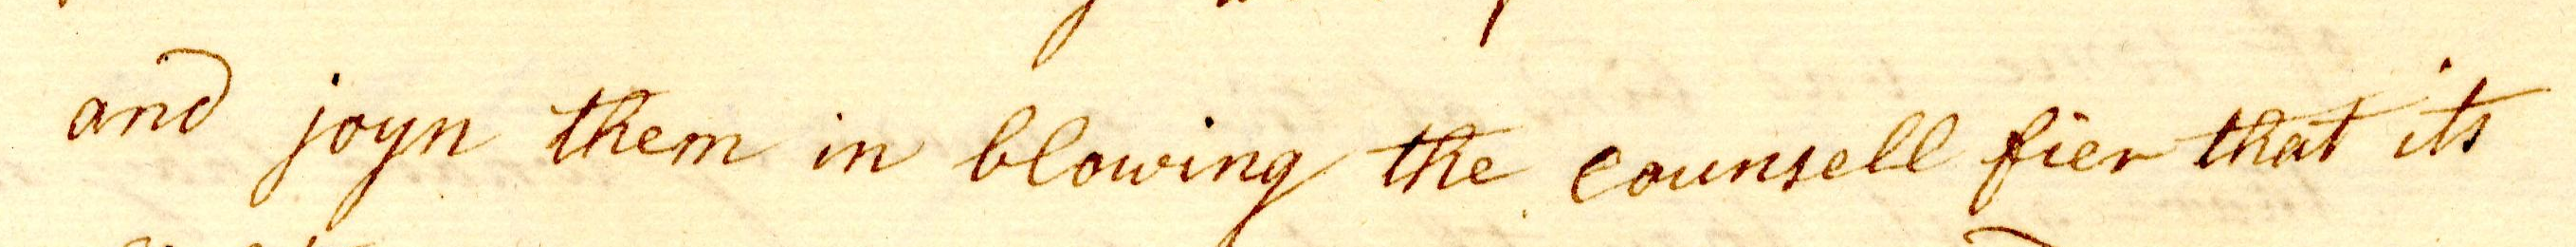and joyn them in blowing the counsell fier that its
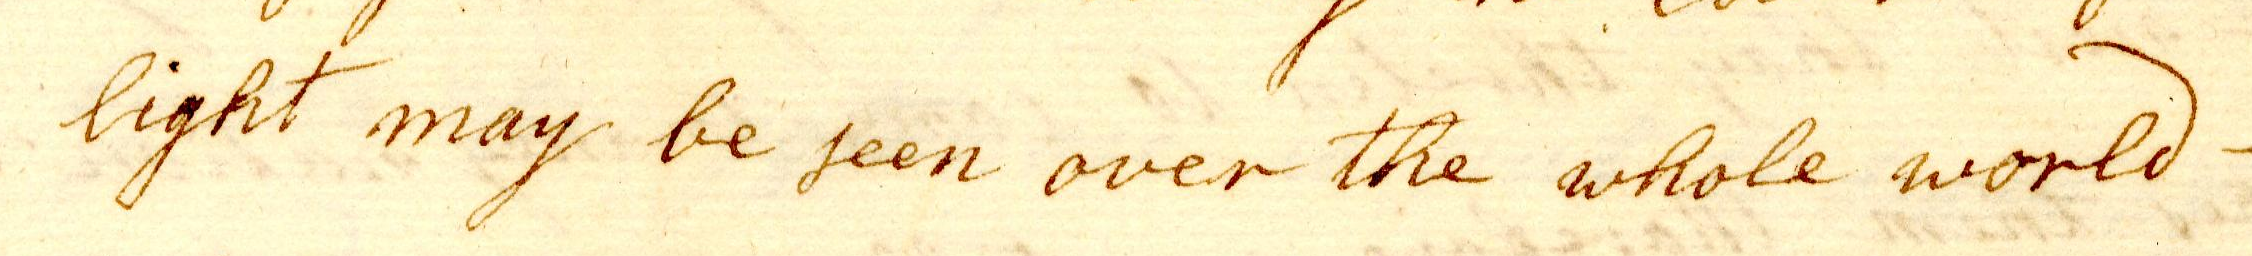light may be seen over the whole world-
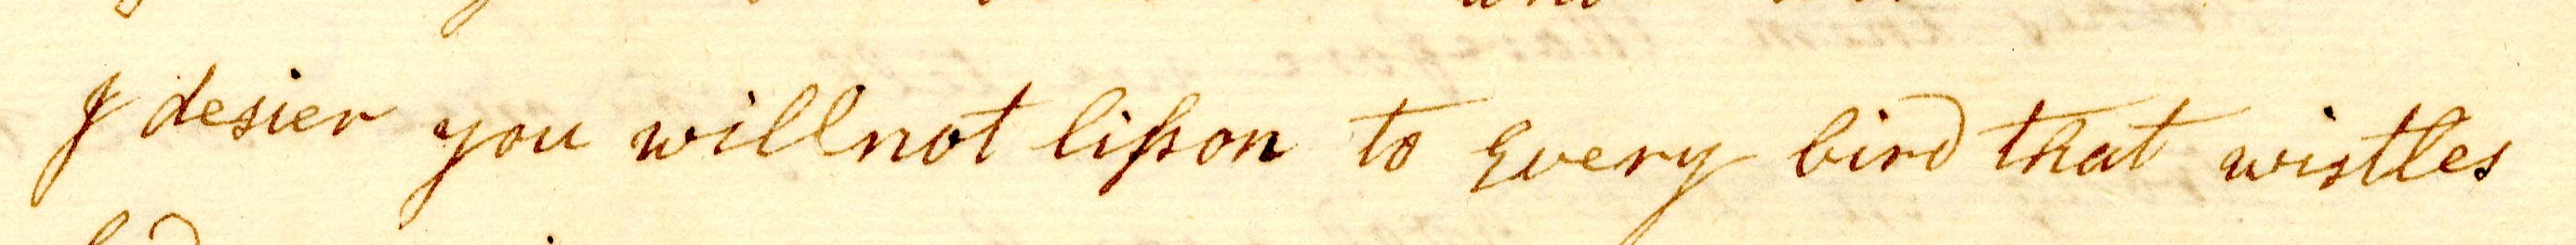I desier you will not lisson to every bird that wistles
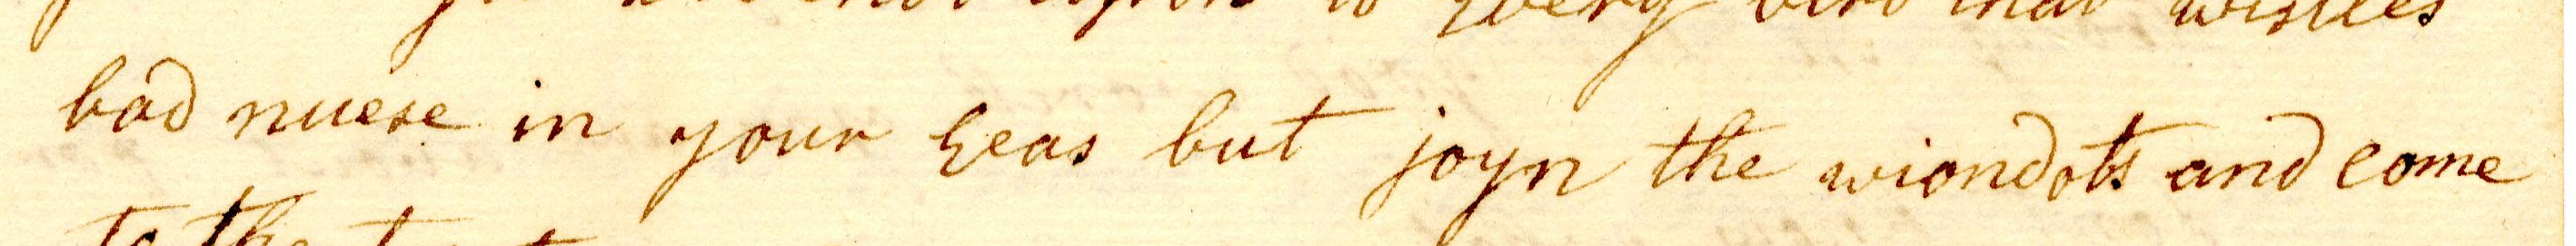bad nuese in your Eers but joyn the wiondots and come
